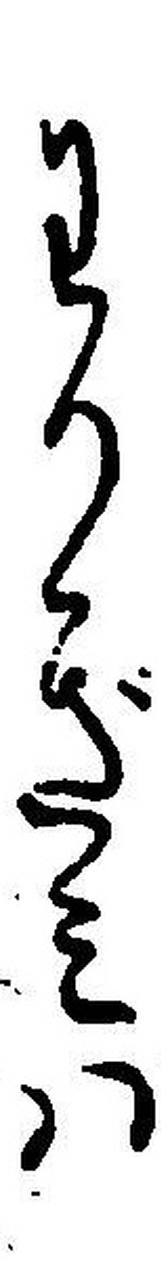わかぎみは
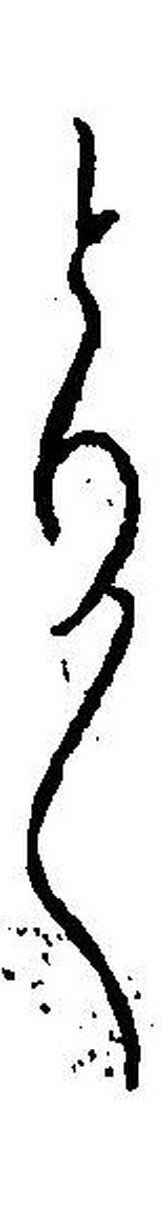とり〳〵
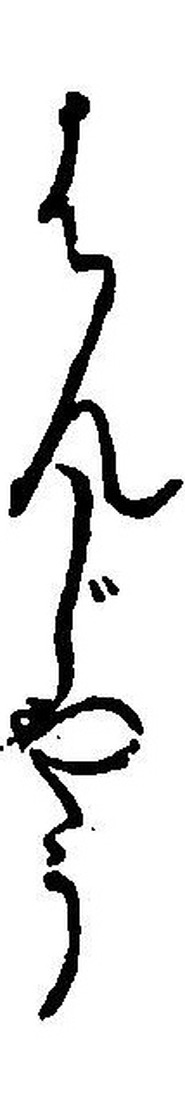はんじやう
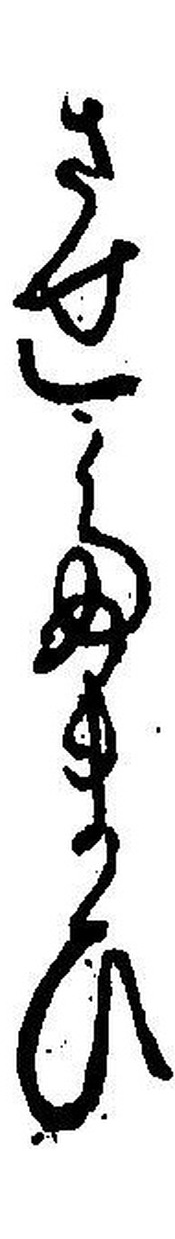させたまひ
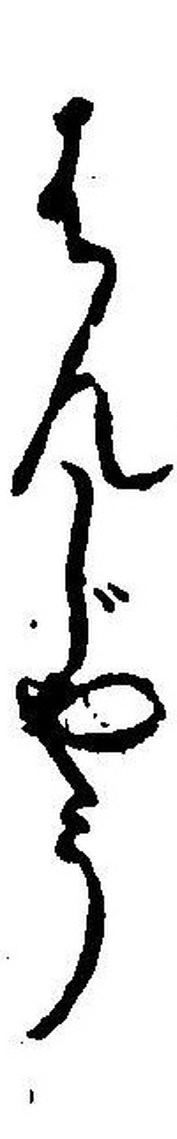はんじやう
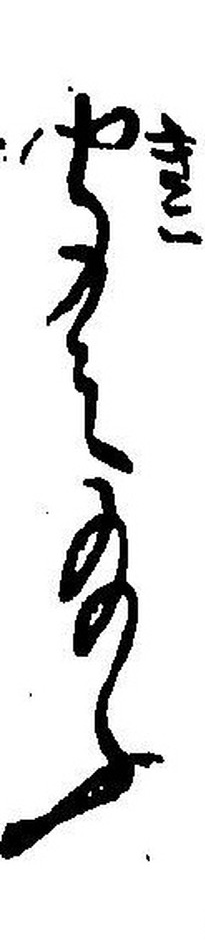聞え給ふ

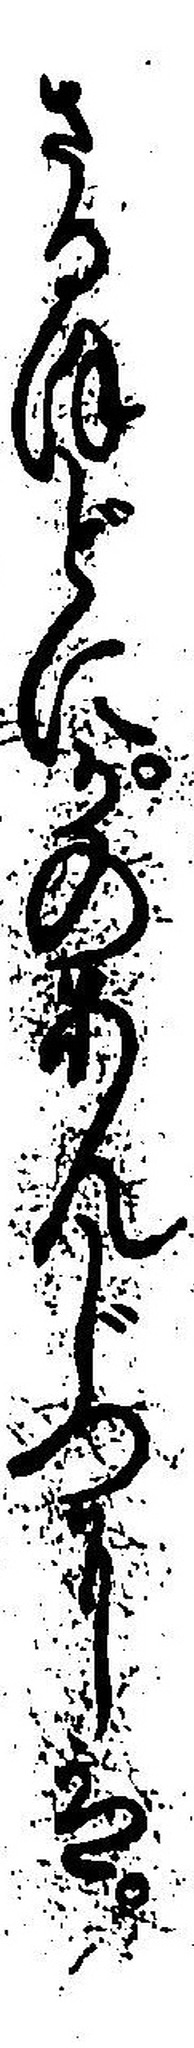さるほどに。かのあんじつには。
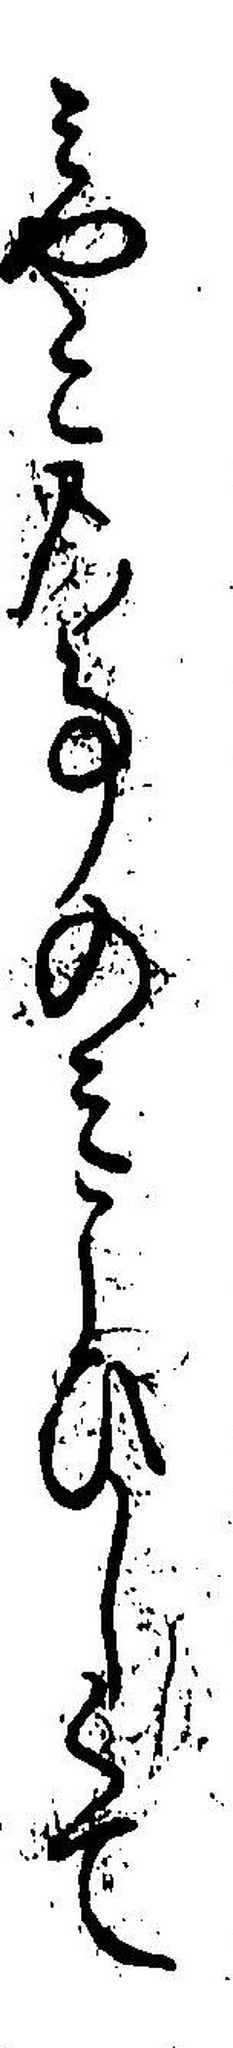みやこの事のみこひしくて
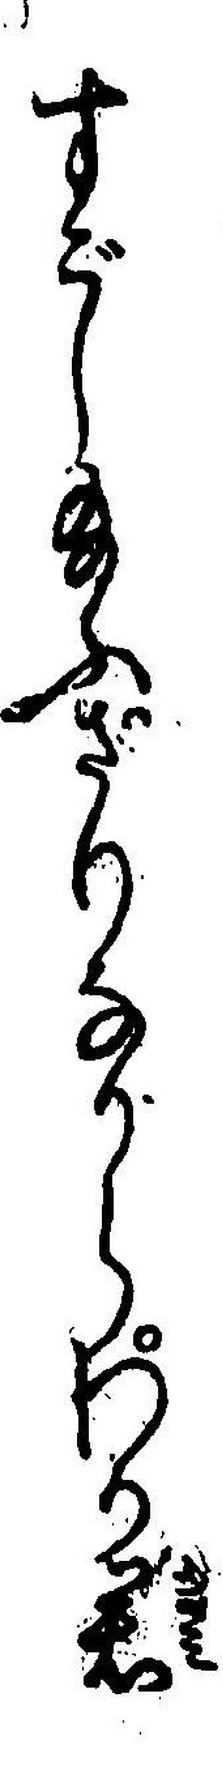すごし給ふ。さりながら。わか君
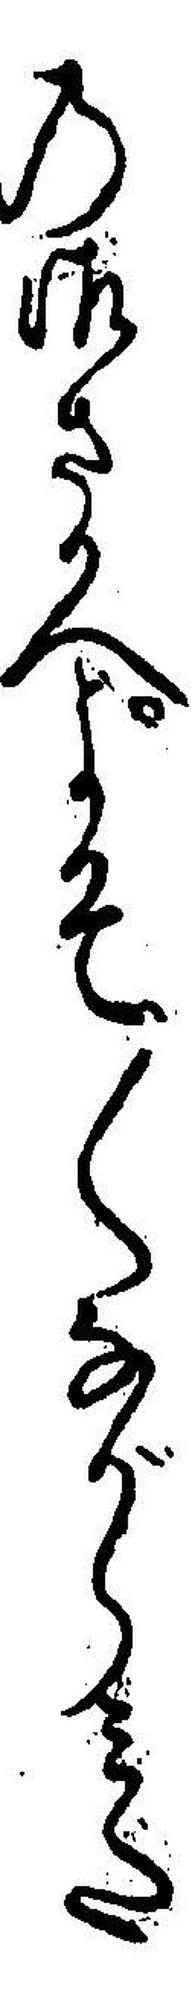の御さかへ。よそ〳〵ながらみた
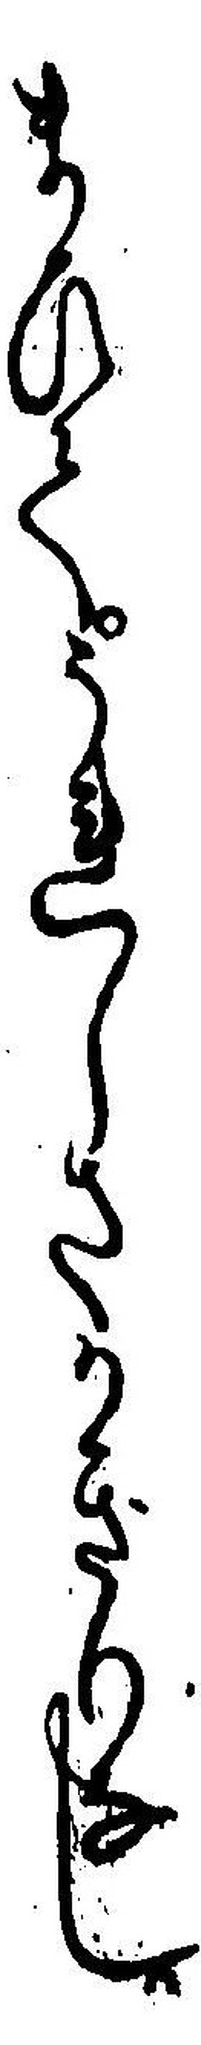まひて。うれしさかぎりなし。
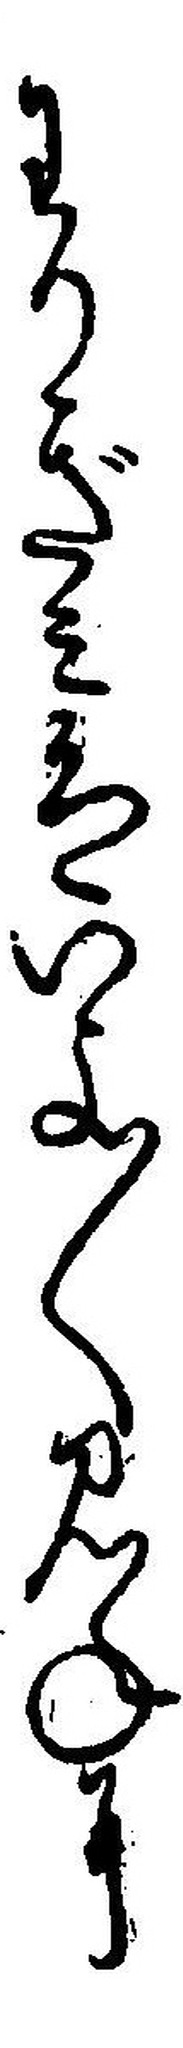わかぎみはいよ〳〵みねに
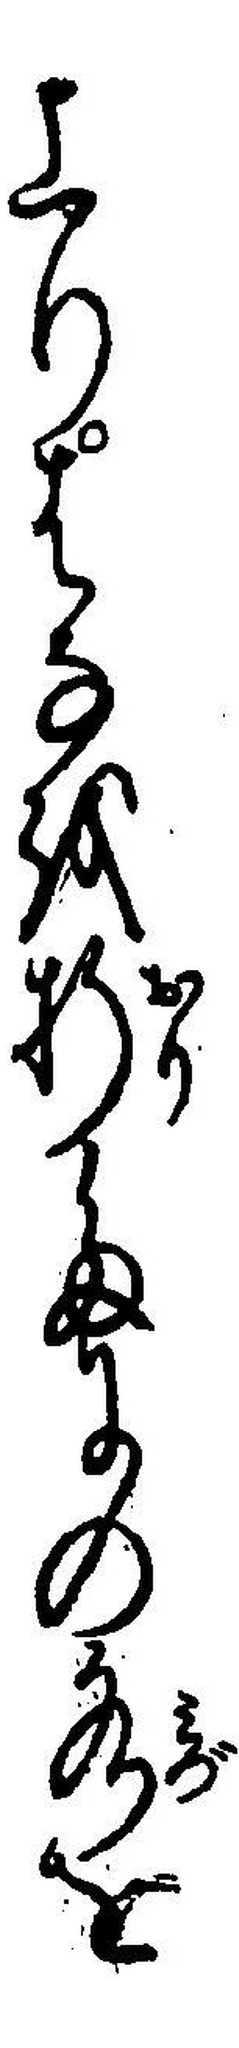上り。はなを折たにの水を
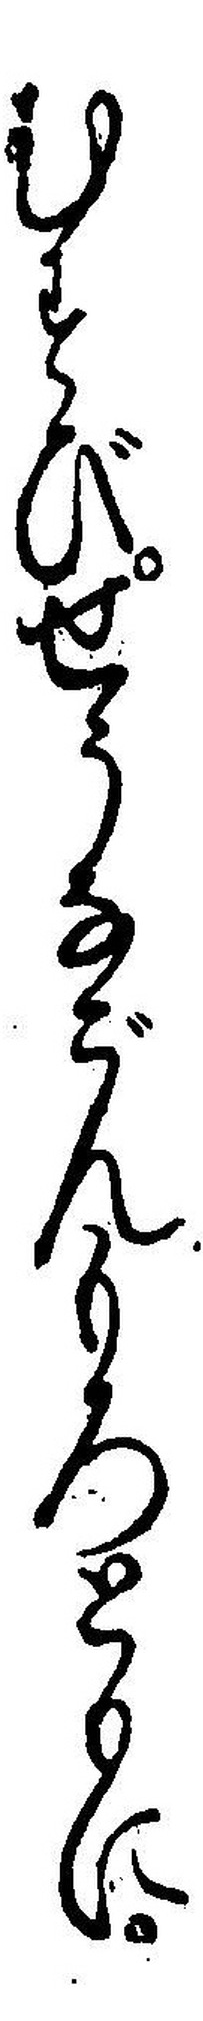むすび。せうなごんもろともに。
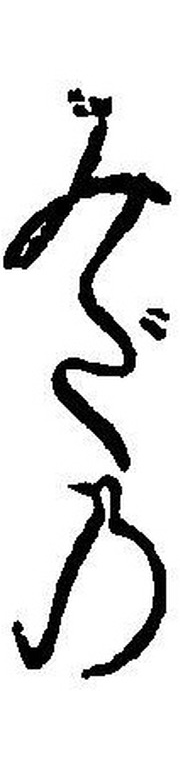みだの
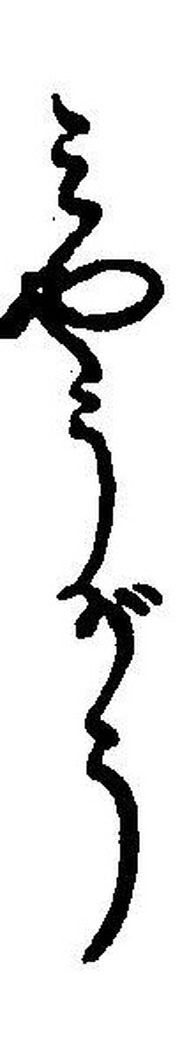みやうがう
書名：木幡きつね
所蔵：東京大学総合図書館 General Library in the University of Tokyo, JAPAN
